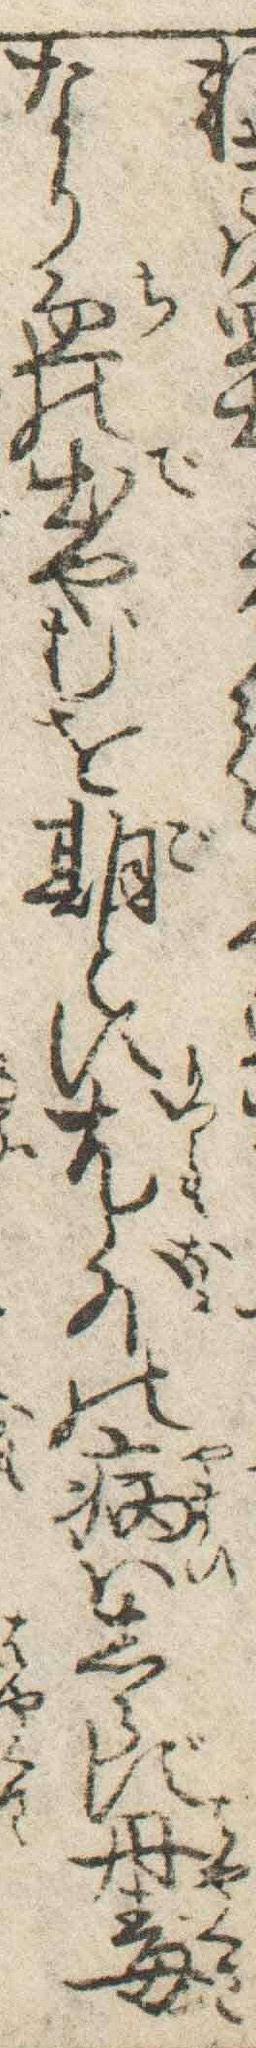なり血の出やむを期とす尤外の病はしらず丹毒
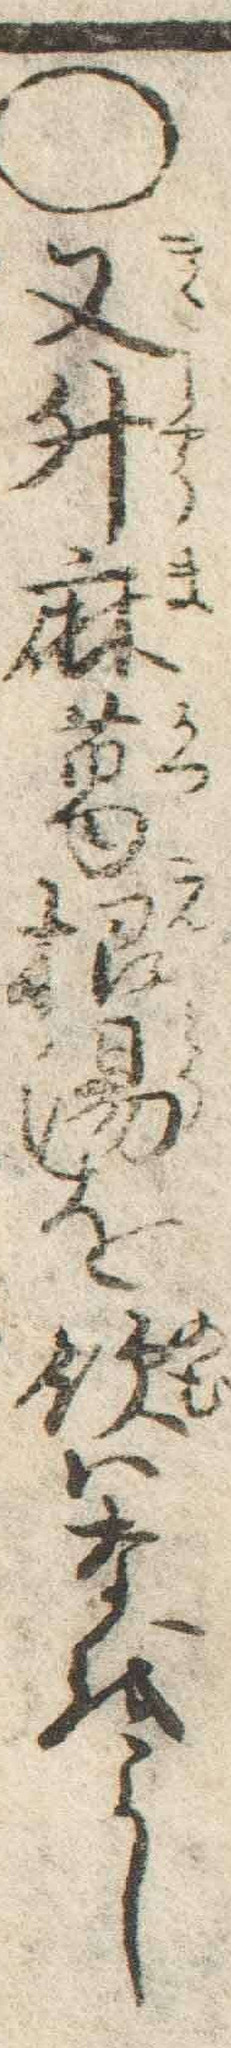〇又升麻葛根湯を飲はなをよし
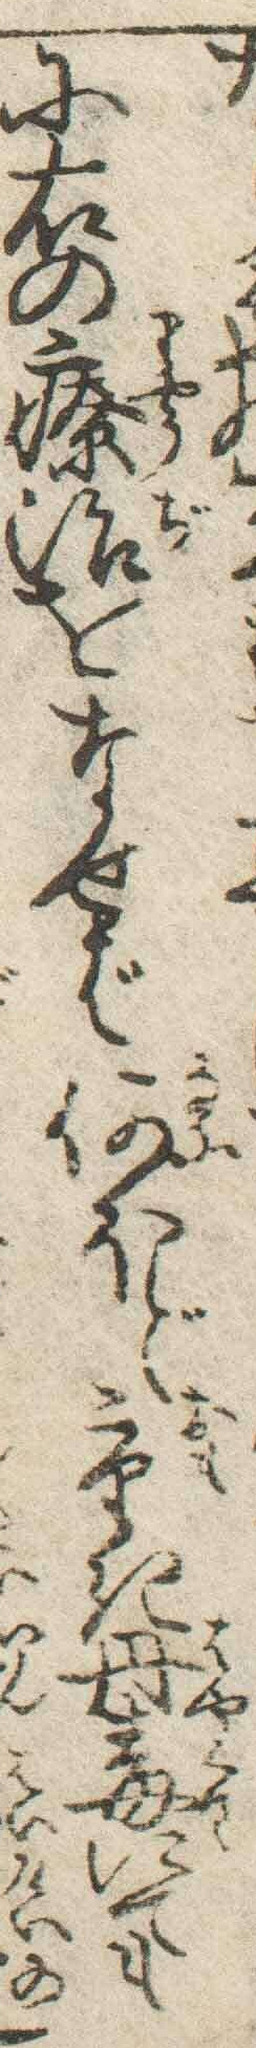に右の療治をなせば何ほど重き丹毒にても
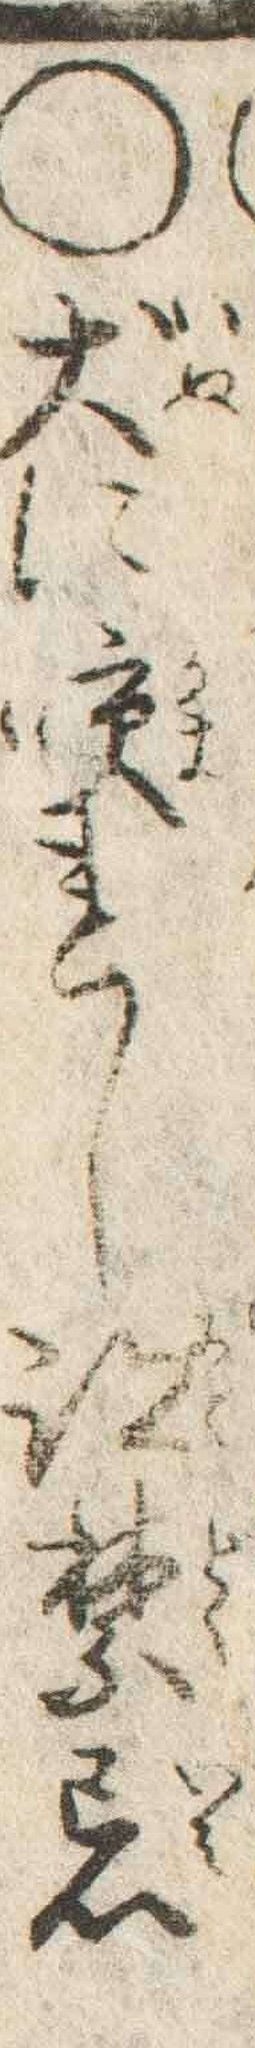〇犬に咬れし跡禁忌
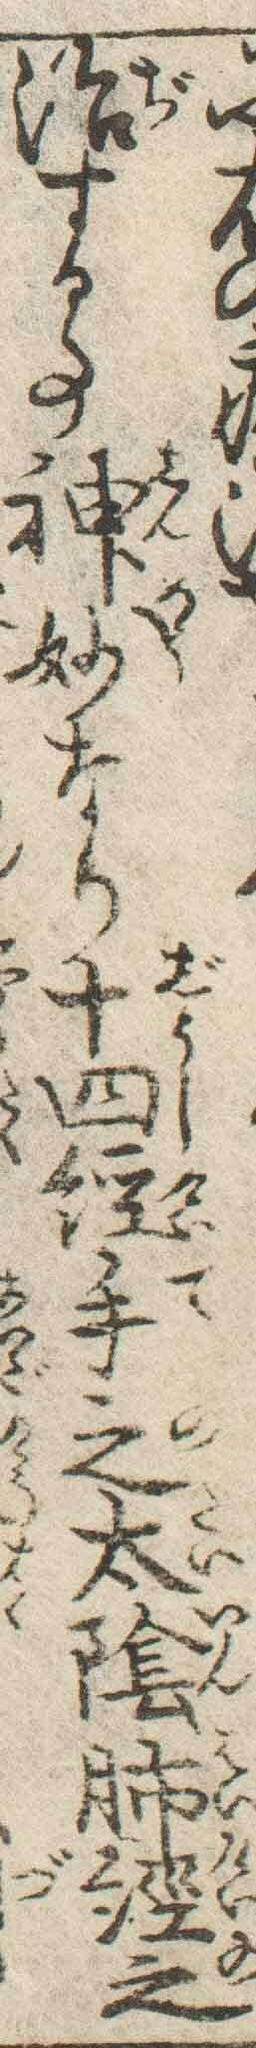治する事神妙なり十四経手之太陰肺経之
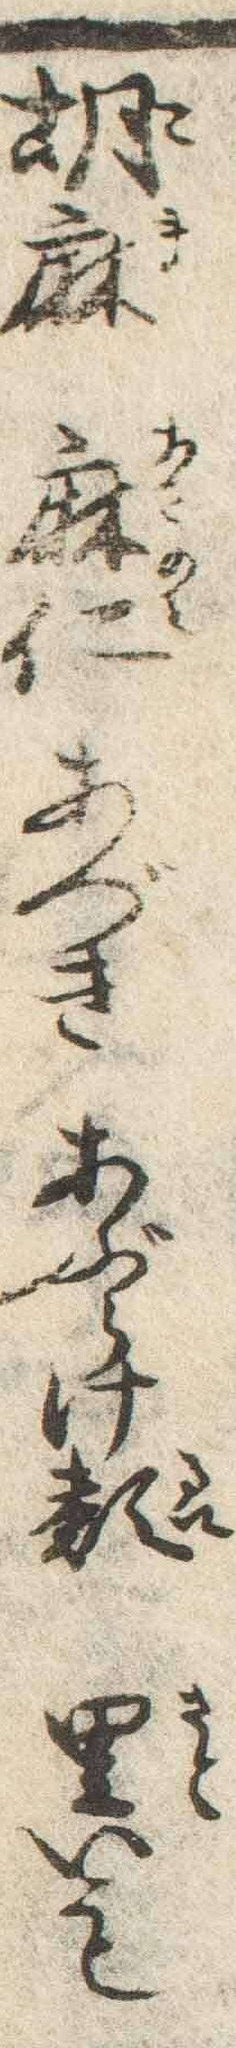胡麻仁あづきあぶらけ類里いも
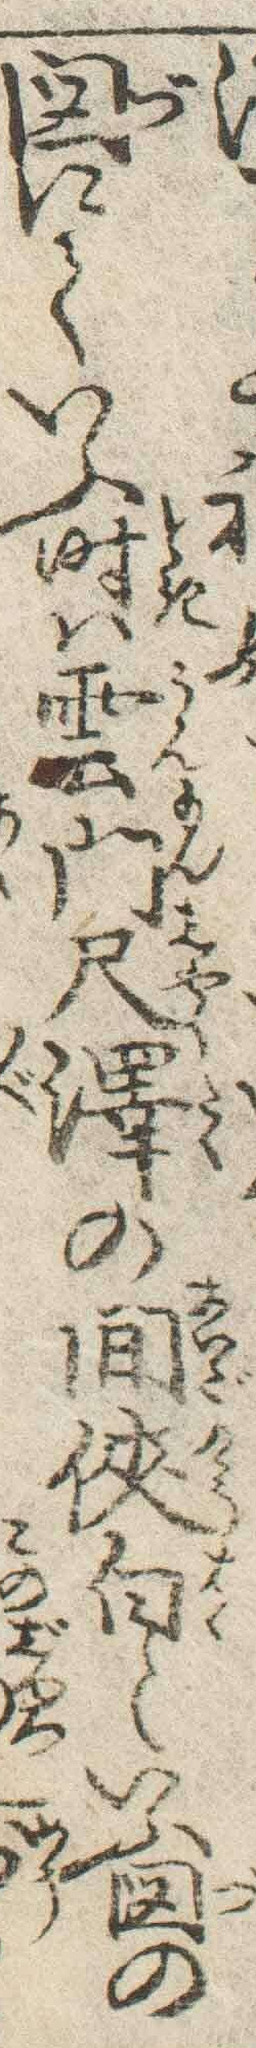図にていふ時は雲門尺沢のあい間侠白といふ図の
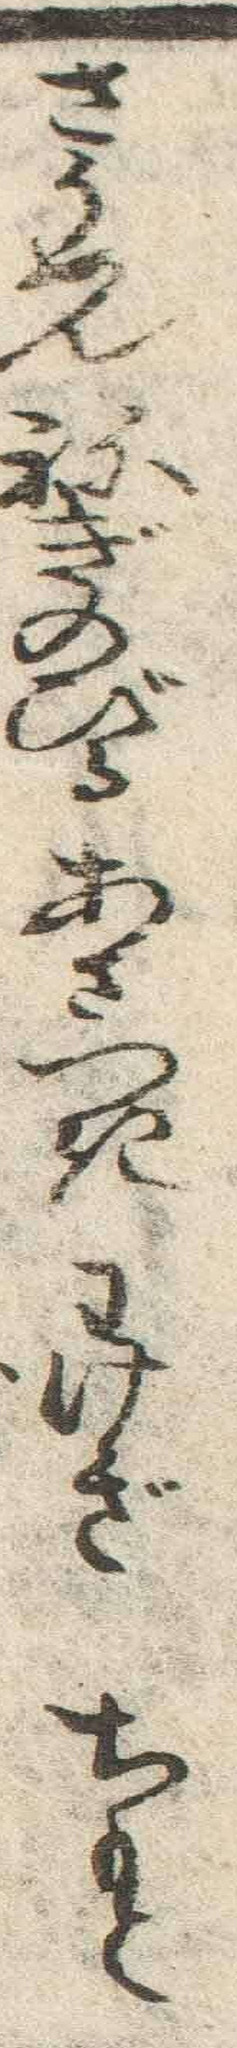さうめんねぎのびるあさつきわけぎちもと
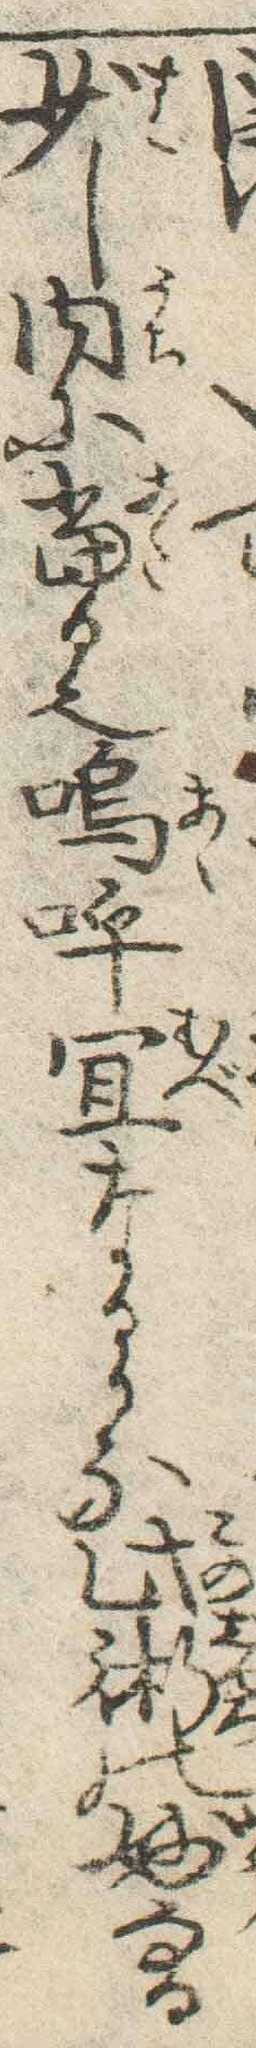少し内に当る也嗚呼宜なるかな此術の妙なる
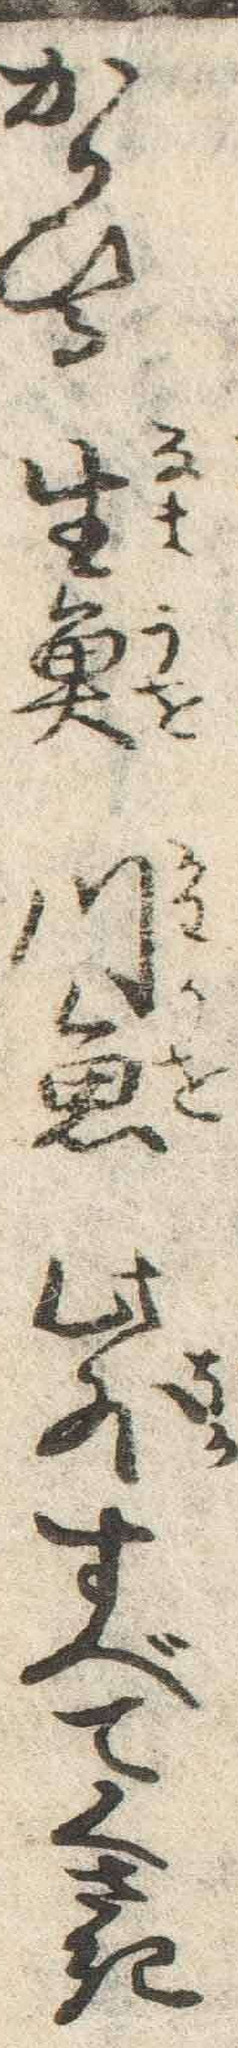かりひる生魚川魚此外すべてくさき
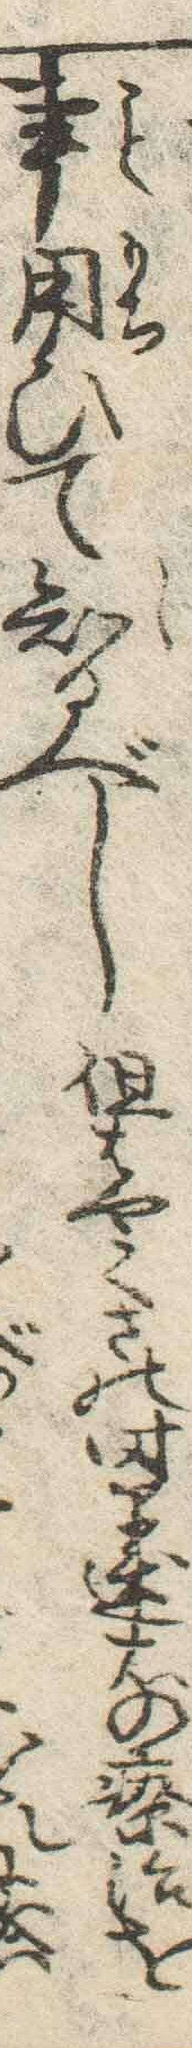事用ひて知るべし但はやくさの時早速右の療治を
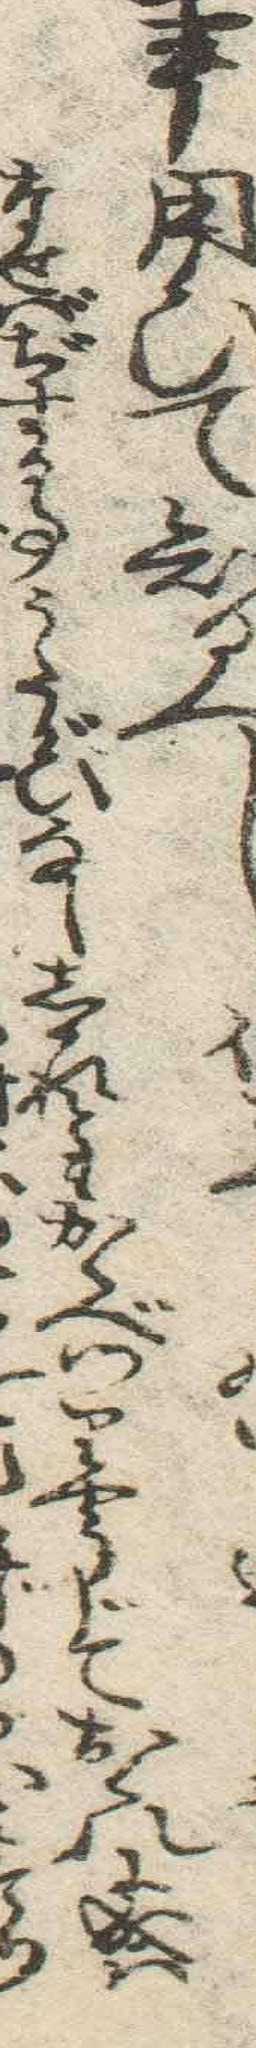なせばぢする事うたがひなししかれともかくべつりやうじておくれに成は
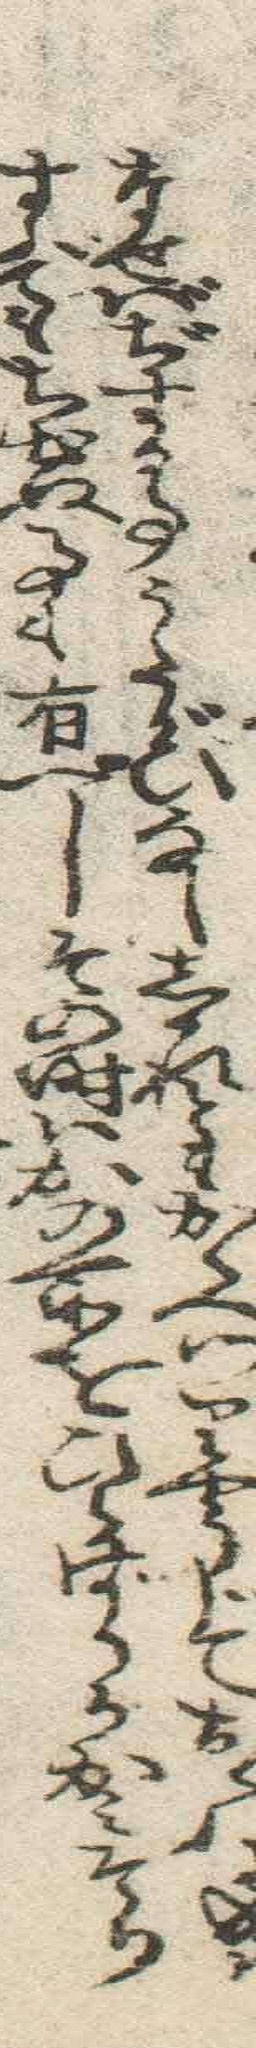すふてもち出ぬ事も有べしその時はかの所をひらばりかかみそり
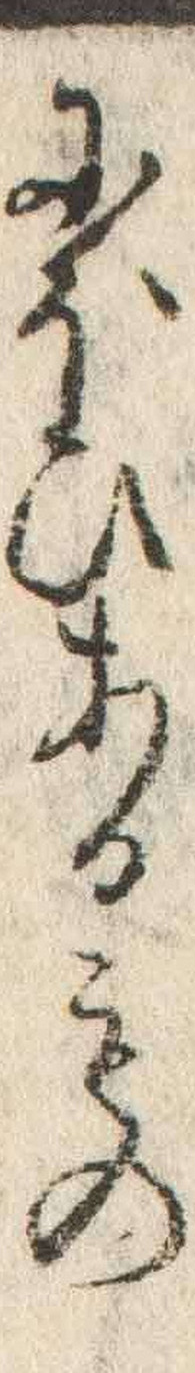にほいあるもの
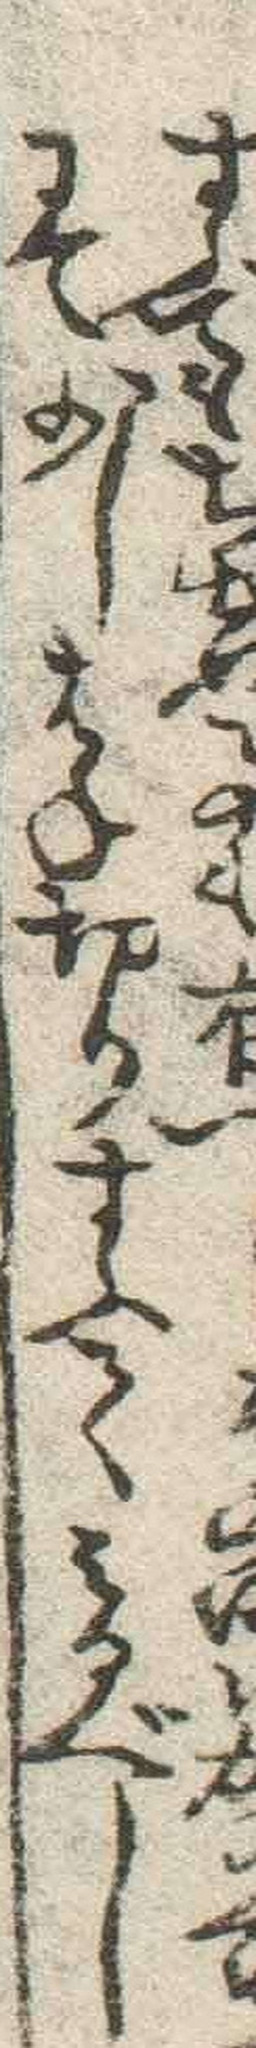にて少しはね切りすふてみるべし
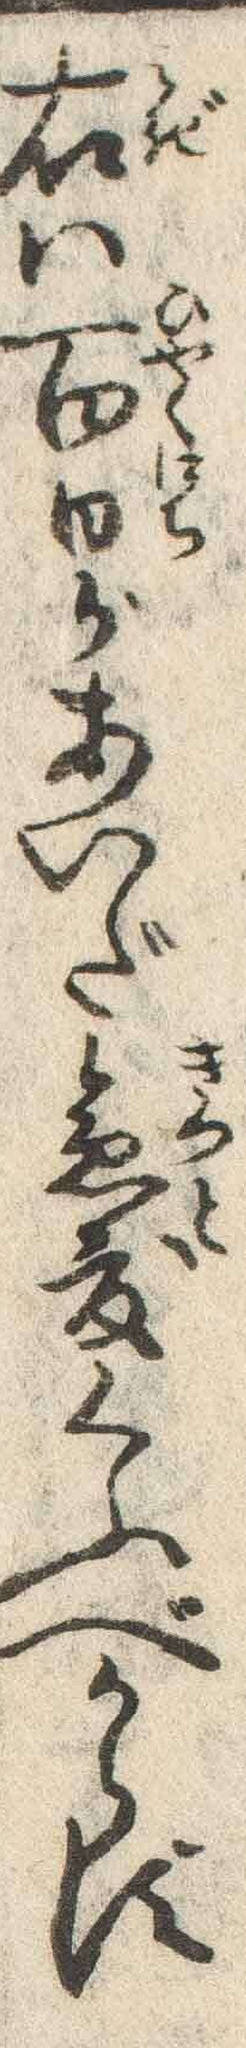右は百日があいだ急度くふべからず
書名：撫育草
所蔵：東京学芸大学附属図書館 国文学研究資料館
